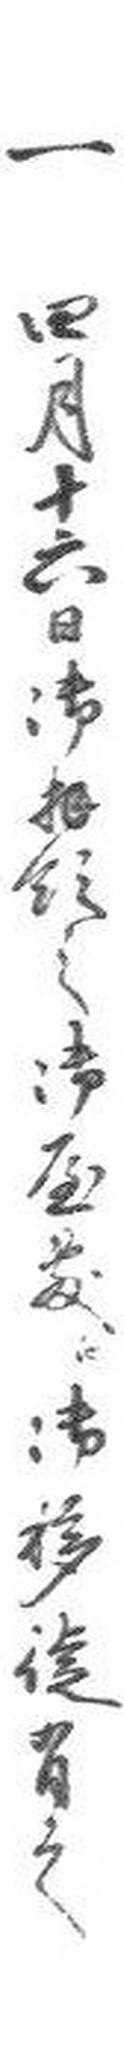一四月十六日御拝領之御屋敷江御移徙有之
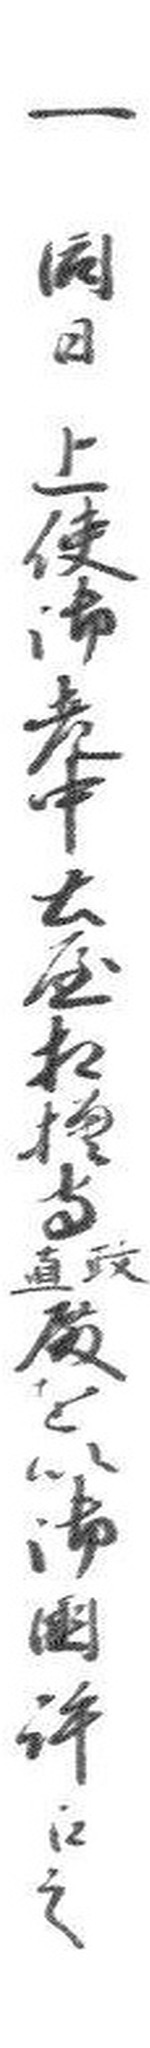一同日上使御老中土屋相模守政直殿を以御国許江之
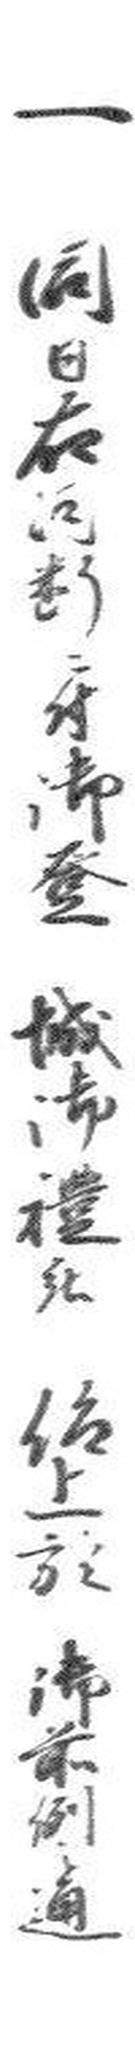一同日右同断ニ付御登城御礼被仰上於御前例之通
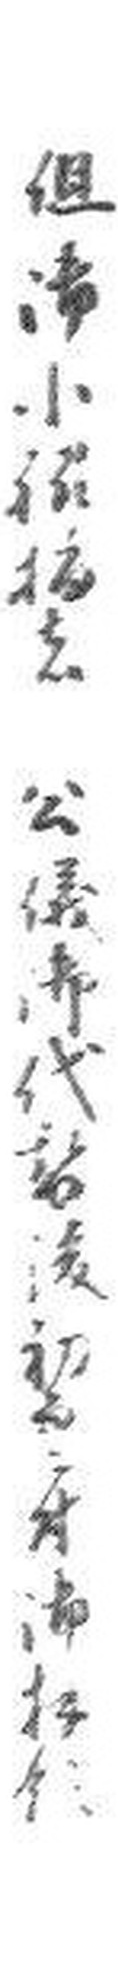但御小脇指者公儀御代替後初而ニ付御拝領
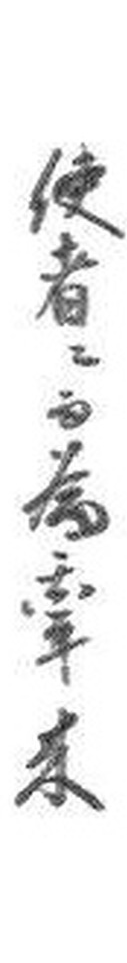使者ニ而為牽来
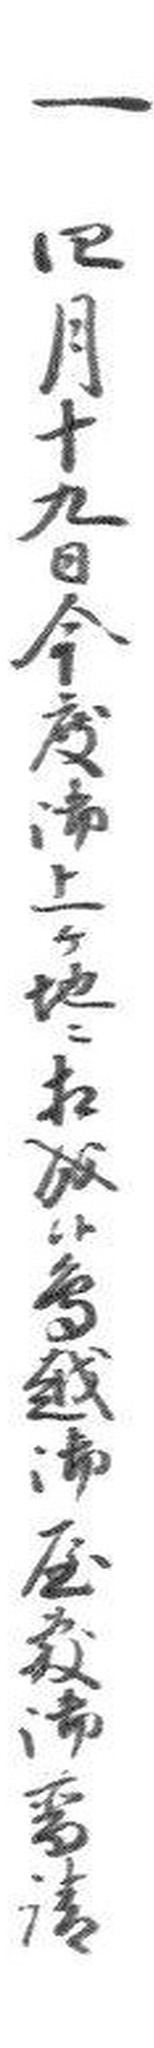一四月十九日今度御上ケ地ニ相成候鳥越御屋敷御普請

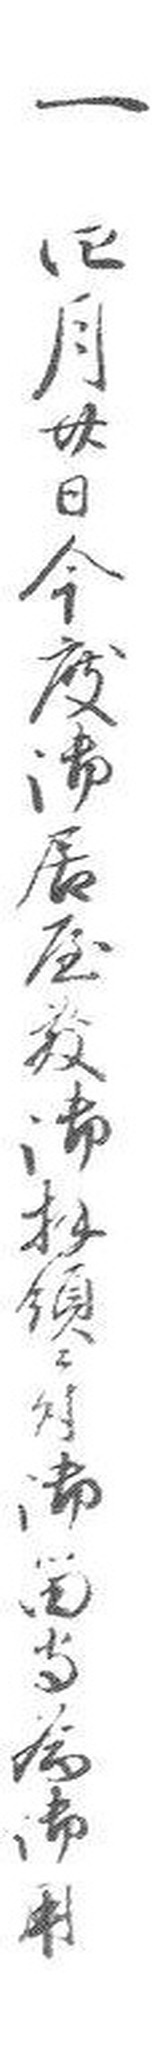一四月廿日今度御居屋敷御拝領ニ付御留守為御用
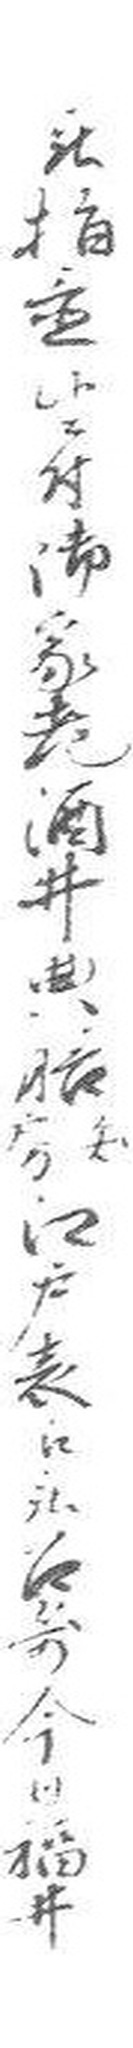被指置候ニ付御家老酒井典膳知房江戸表江被召寄今日福井
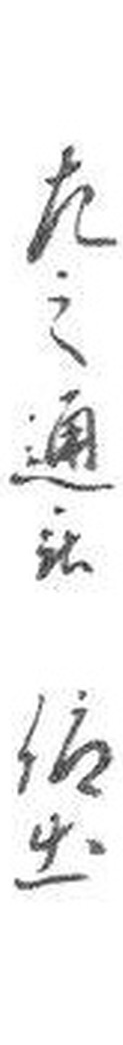左之通被仰出
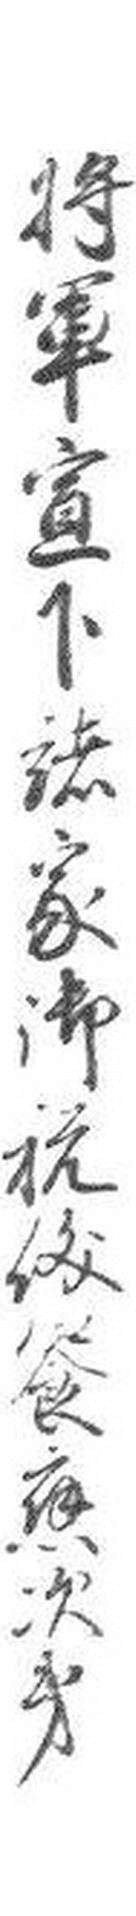将軍宣下諸家御祝儀饗応次第
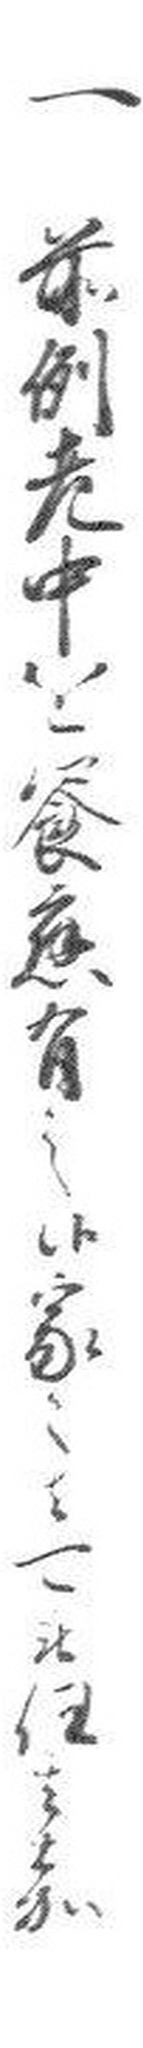一前例老中を饗応有之候家々者可被任其嘉
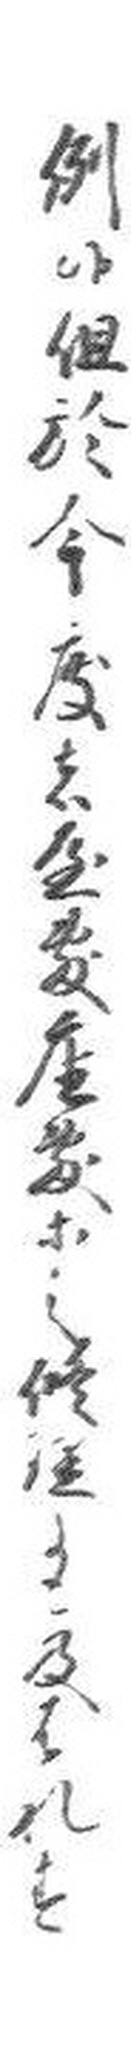例候但於今度者屋敷座敷等之修理に及はれす
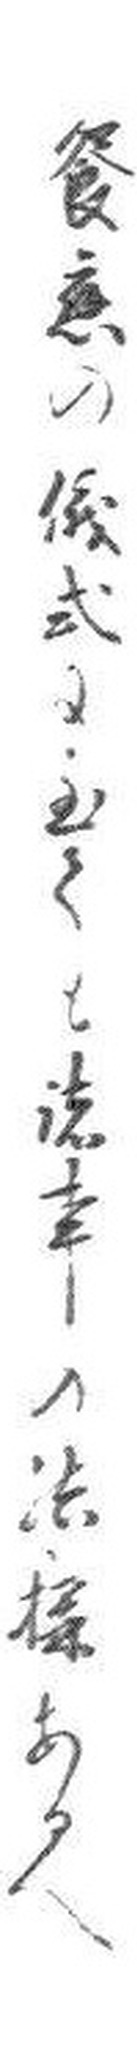饗応の儀式に至ても諸事の結構あるへ
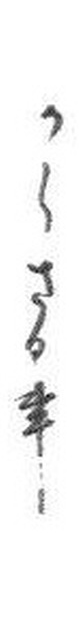からさる事
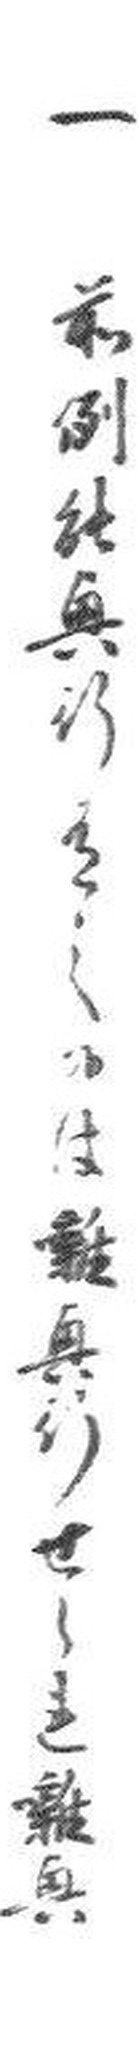一前例能興行有之候囃興行せられ囃興
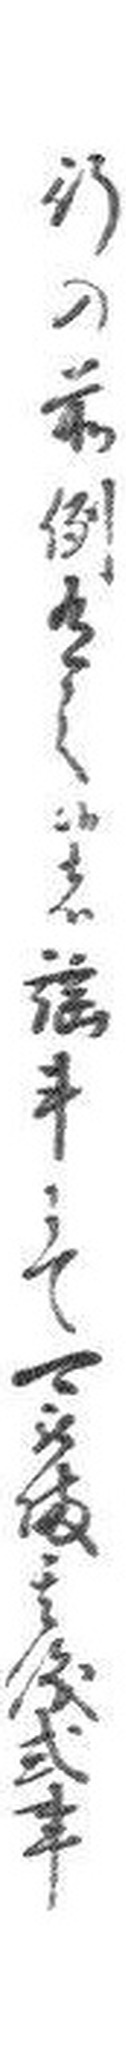行の前例有之候者謡斗にて可被備其儀式事
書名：家譜 二十九 吉邦公 従正徳二年到正徳三年
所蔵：福井県文書館 Fukui Prefectural Archives
